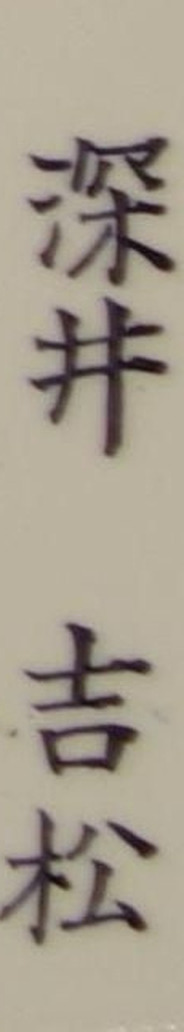深井吉松
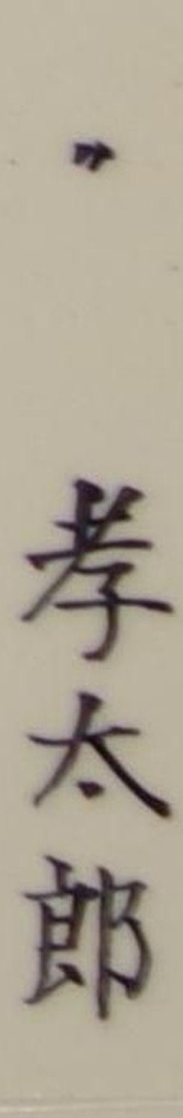孝太郎
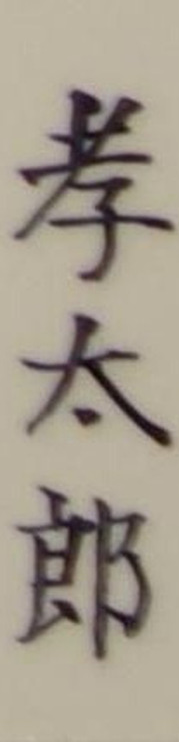孝太郎
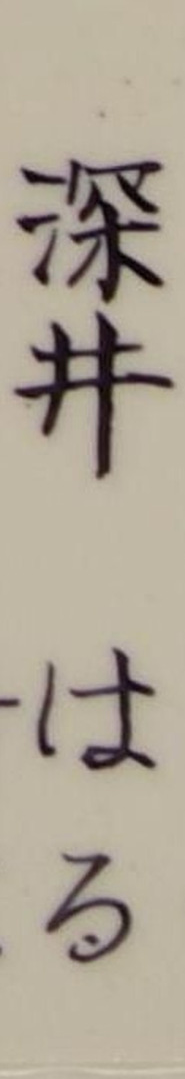深井はる
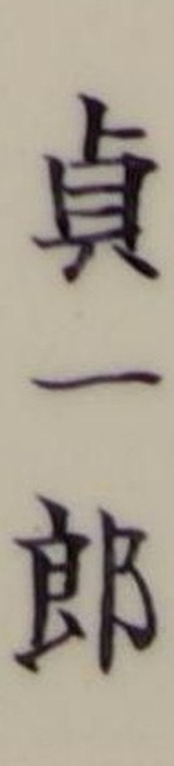貞一郎
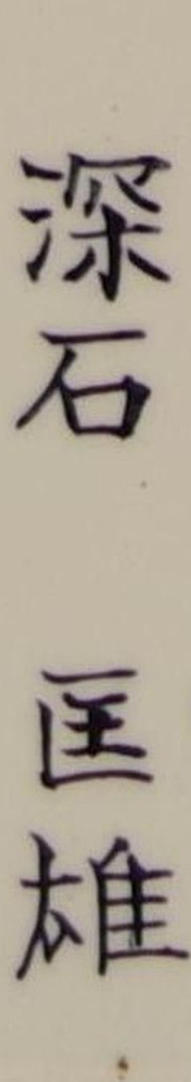深石匡雄
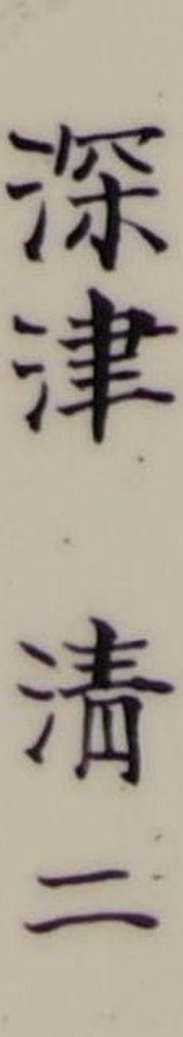深津清二
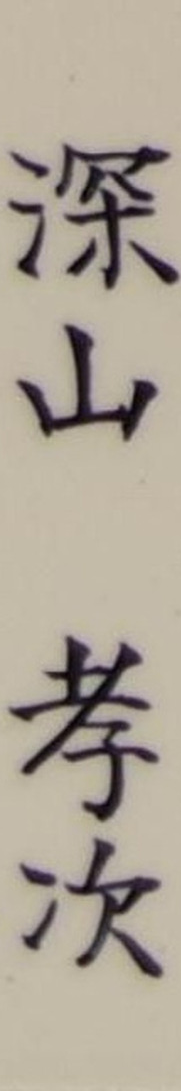深山孝次
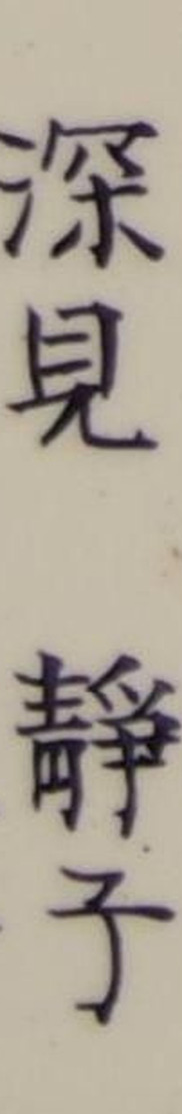深見静子
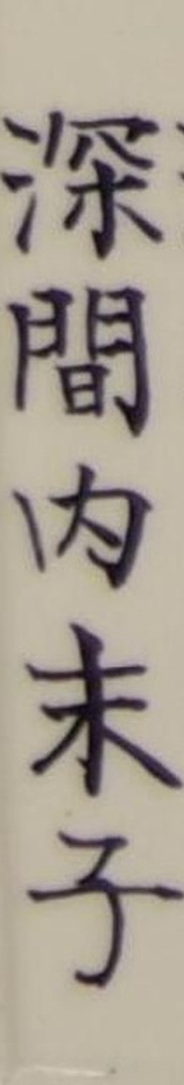深間内未子

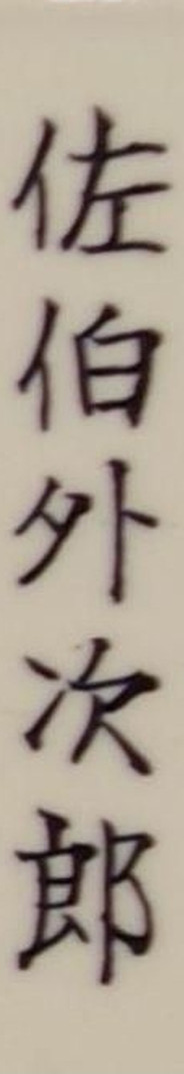佐伯外次郎
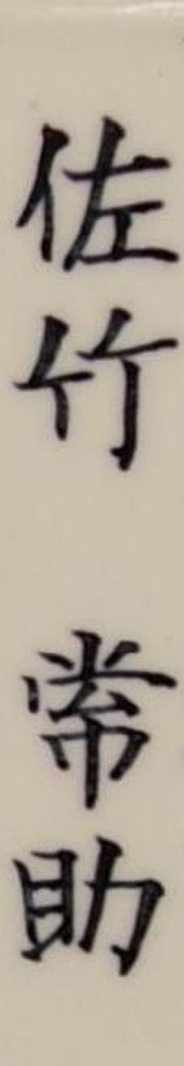佐竹常助
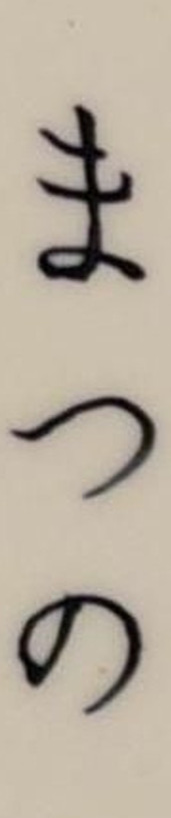まつの
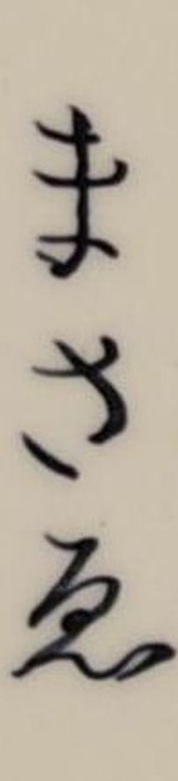まさえ
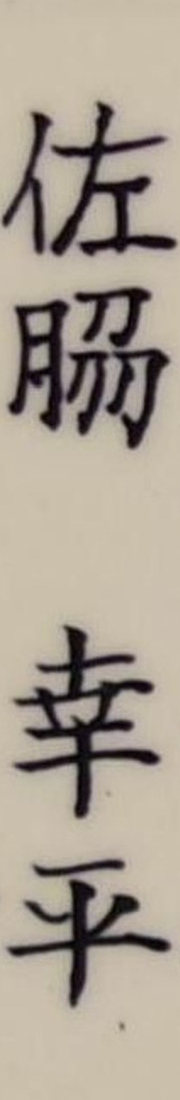佐脇幸平
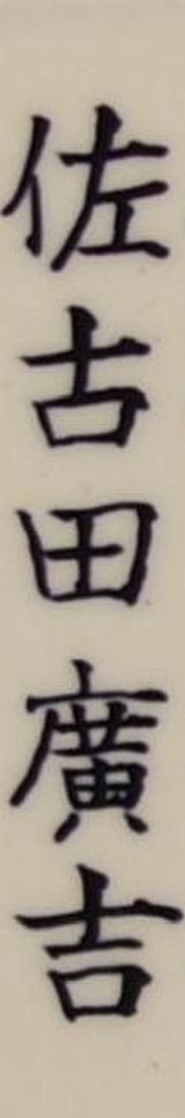佐古田廣吉
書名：E~L
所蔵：高野山金剛峯寺
